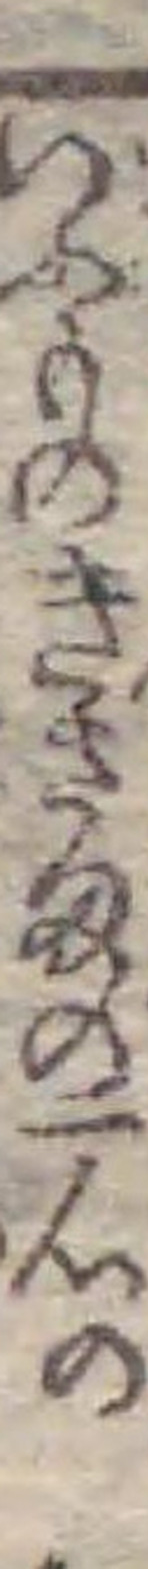いふものきさまの一心の
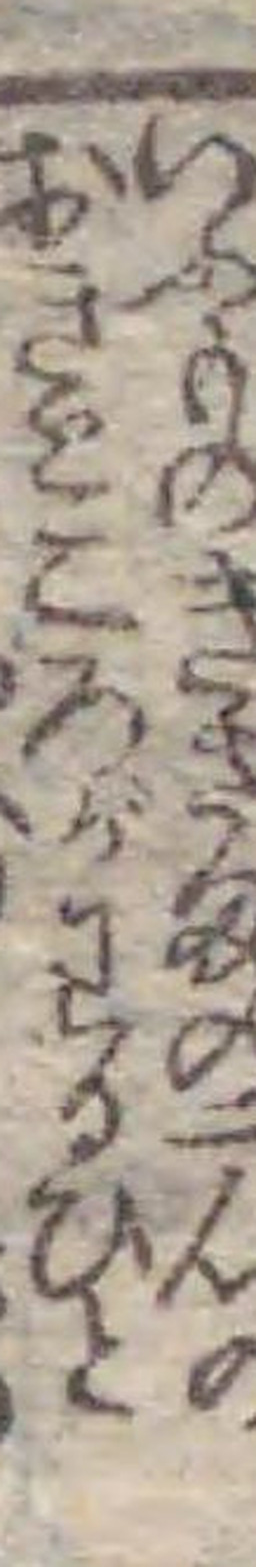おきところがわるひと
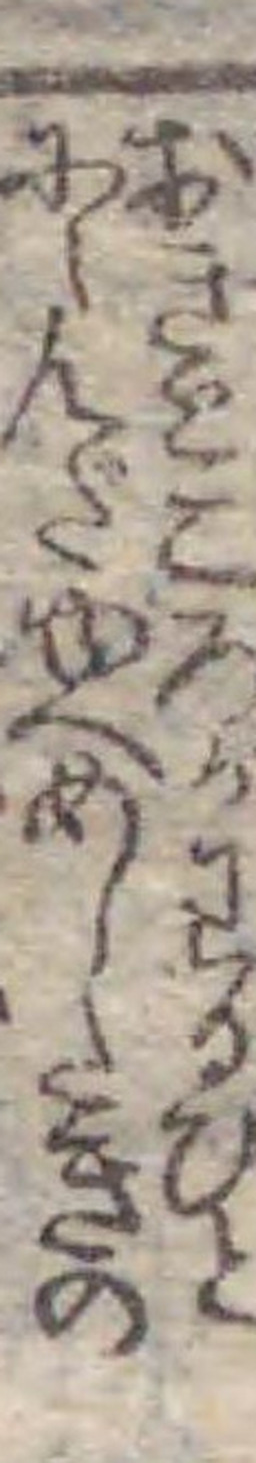にらんだゆへめしたきの
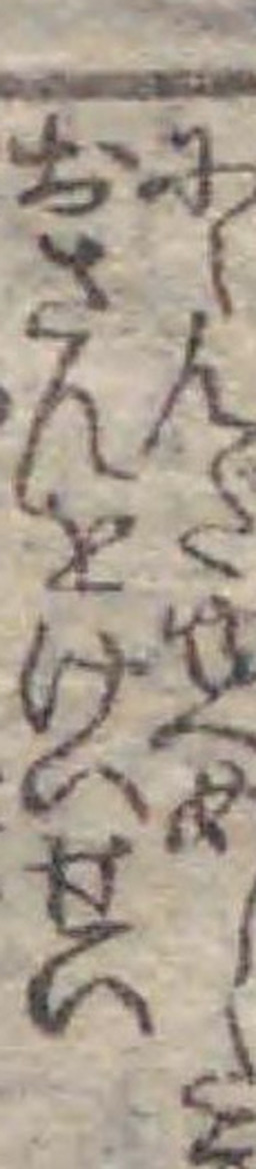おさんをけいせい
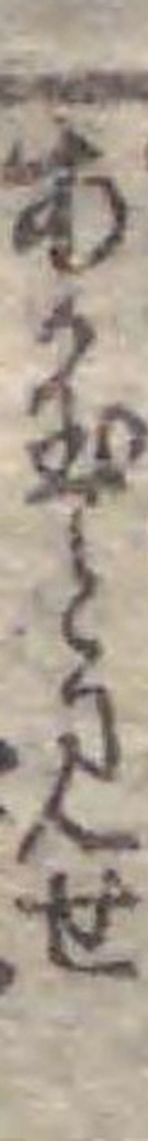あか玉と見せ
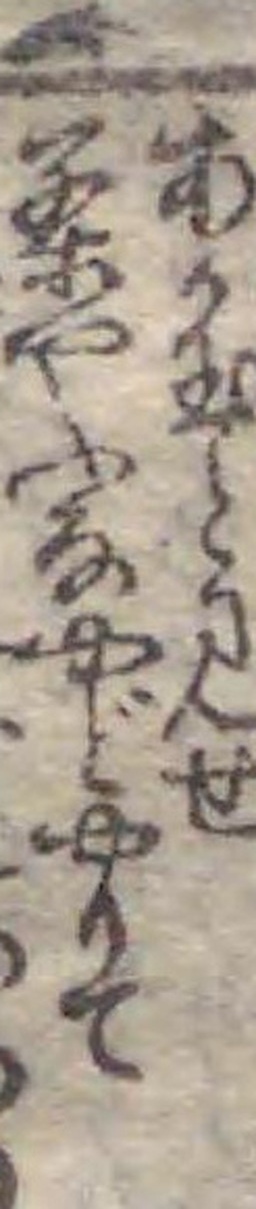茶やふなやどやりて
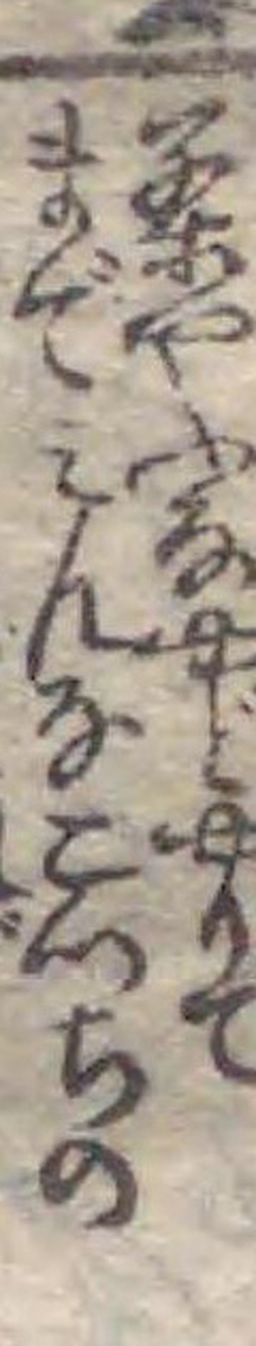までみんなこつちの
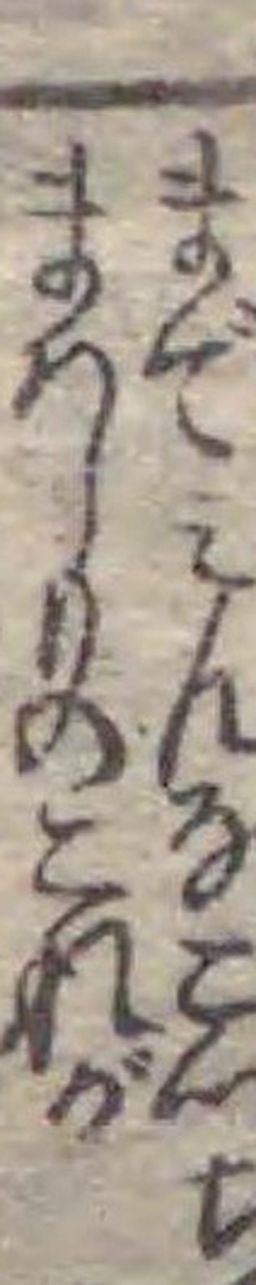まはしものこれが
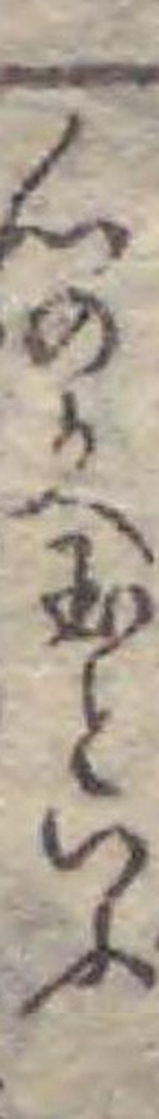心のかへ玉といふ
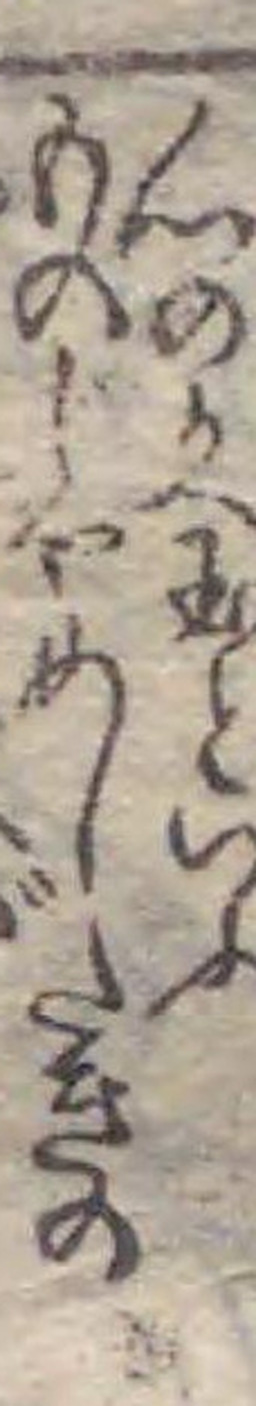ものじやめしたきの
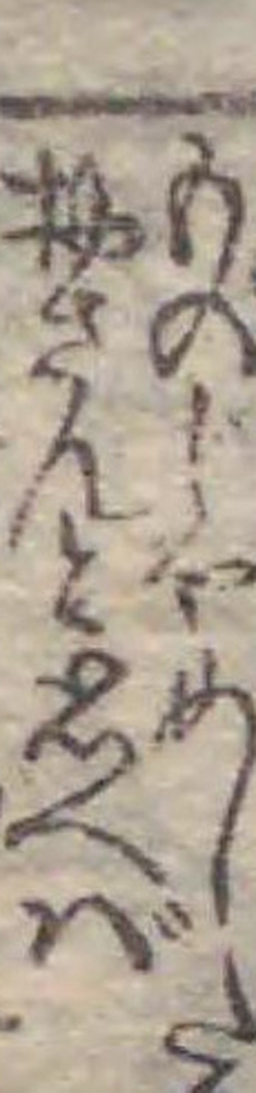おさんと思へば
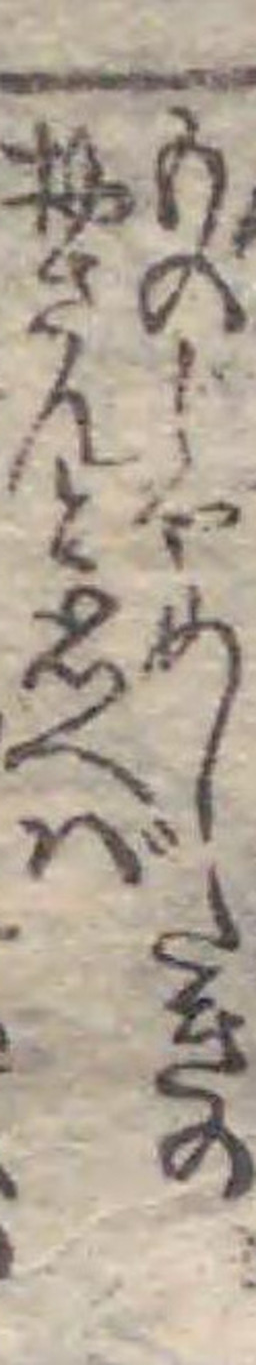おさんと思へば
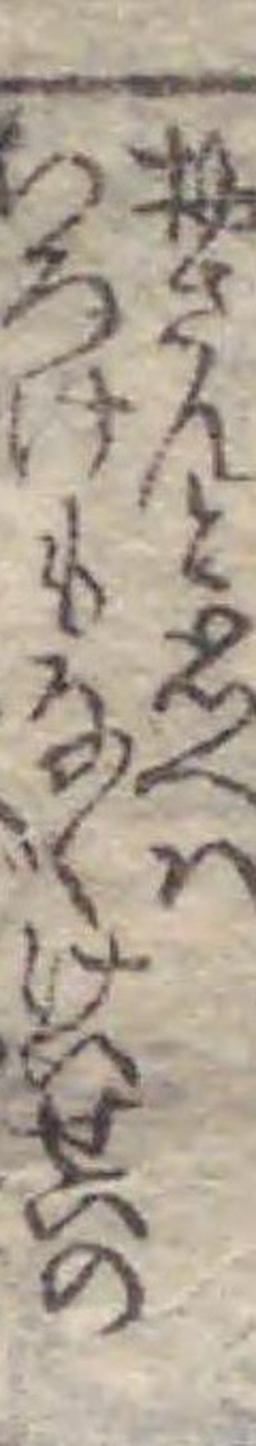いろけもなくけいせいの
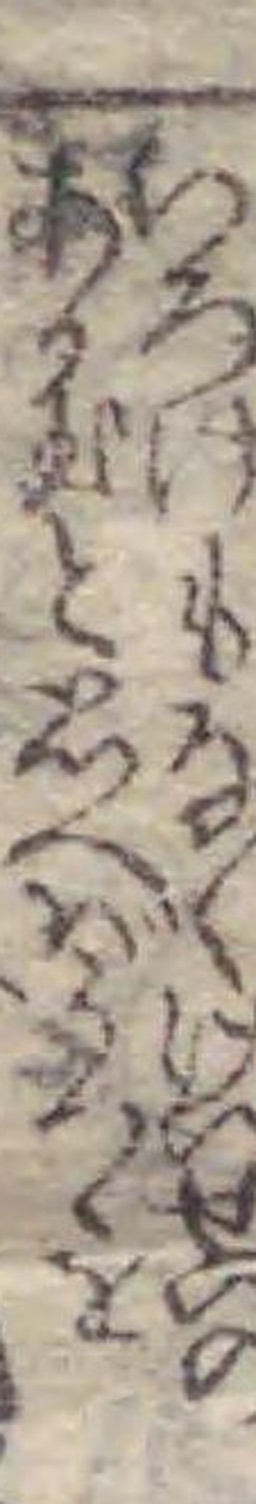あか玉と思へばうつゝを
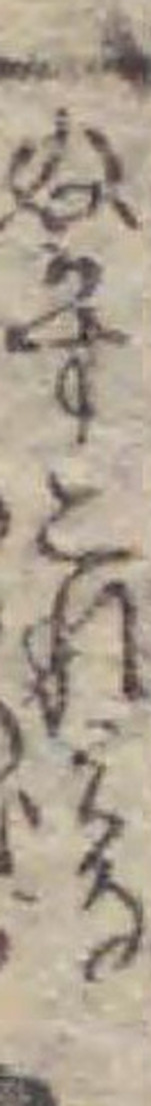ぬかすこれみな
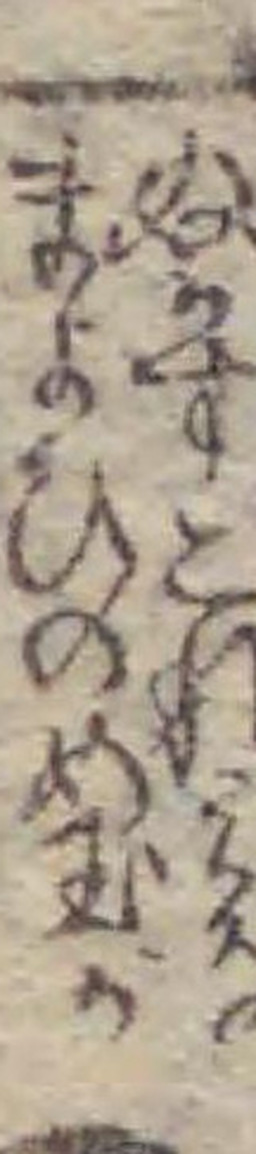まよひのめ玉が
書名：四遍搨心学草帋 : 3巻
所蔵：国立国会図書館 National Diet Library, JAPAN
